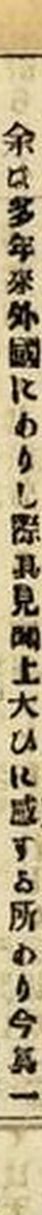余は多年来外国にありし際其見聞上大ひに感する所あり今其一
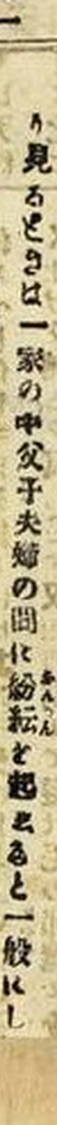り見るときは一家の中父子夫婦の間に紛紜を起したと一般にし
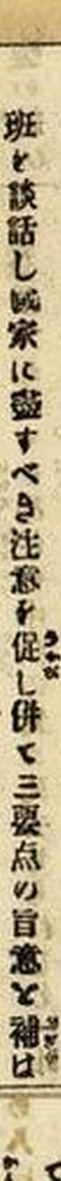班を談話し国家に尽すべき注意を促し併て三要点の旨意を補は
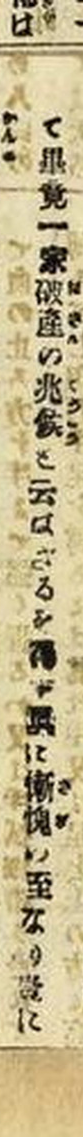て畢竟一家破産の兆候と云はざるを得す実に慚愧の至なり豈に
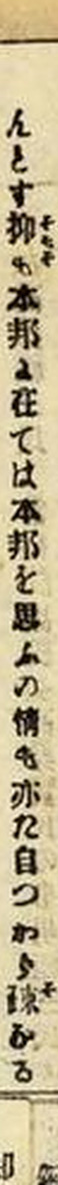んとす抑も本邦に在ては本邦を思ふの情も亦た自つから疎なる
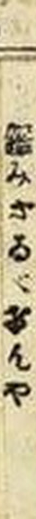鑑みざるべけんや
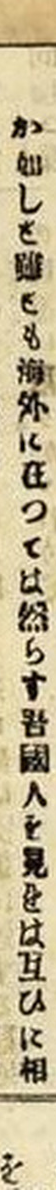か如しと雖とも海外に在つては然らす吾国人を見れは互ひに相
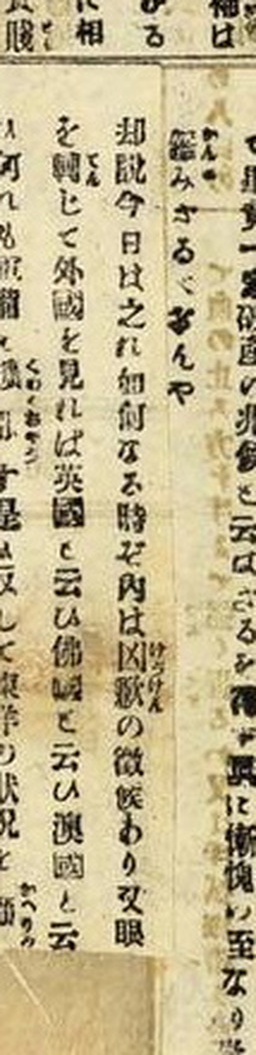却説今日は之れ如何なる時ぞ内は凶歉の徴候あり又眼
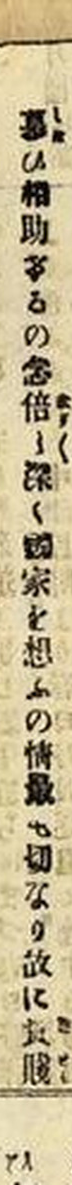慕ひ相助けるの念倍々深く国家を想ふの情最も切なり故に貴賤
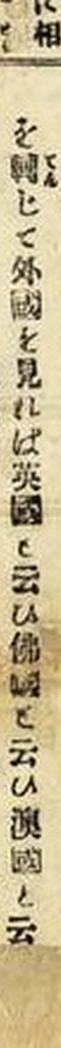を転じて外国を見れば英国と云ひ仏国と云ひ澳国と云
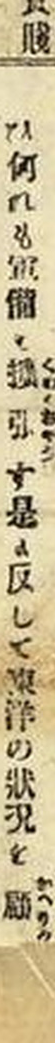ひ何れも軍備を拡張す是に反して東洋の状況を顧
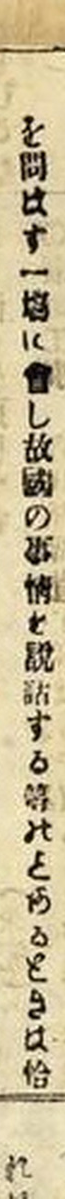を問はす一場に会し故国の事情を説話する等のことあるときは恰
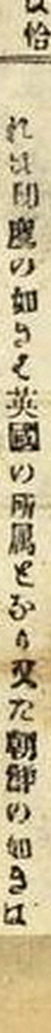れとも印度の如きは英国の所属となり又た朝鮮の如きは
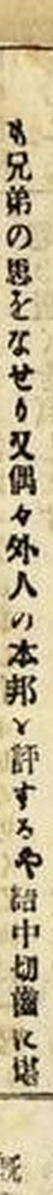も兄弟の思をなせり又偶々外人の本邦を評するや語中切歯に堪
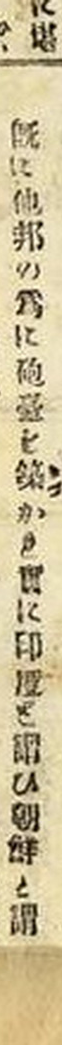既に他邦の為に砲台を築かれ実に印度と謂ひ朝鮮と謂
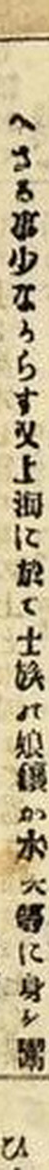へさる事少なからす又上海に於て士族の娘嬢か水兵等に身を鬻
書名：温古集 五巻
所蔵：福井県文書館 Fukui Prefectural Archives
